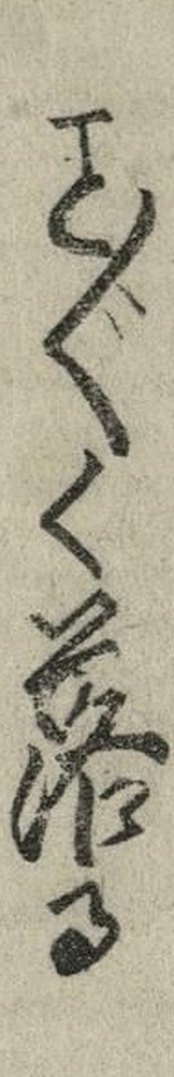こと〴〵く落る
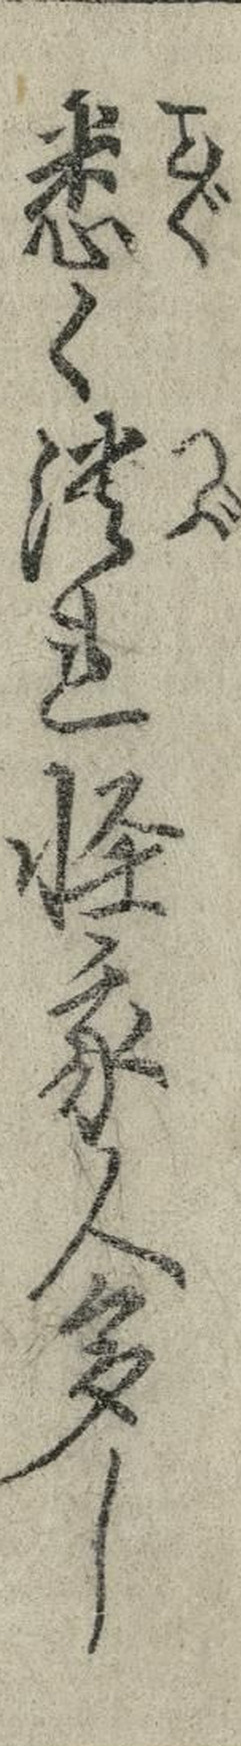悉く潰れ怪我人多し
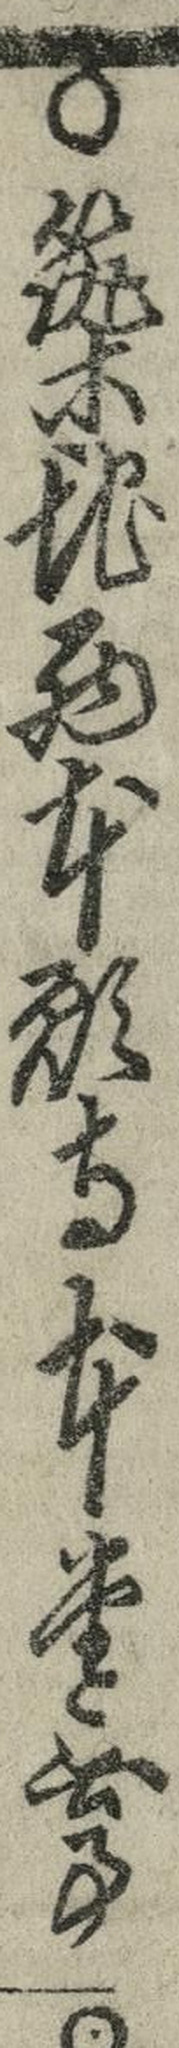○築地西本願寺本堂無事
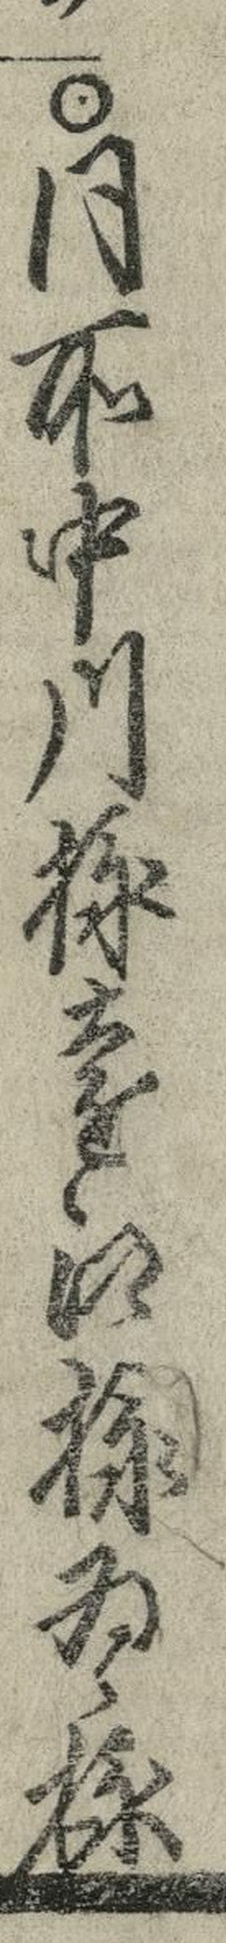○同所中川様遠江様ゐゝ様
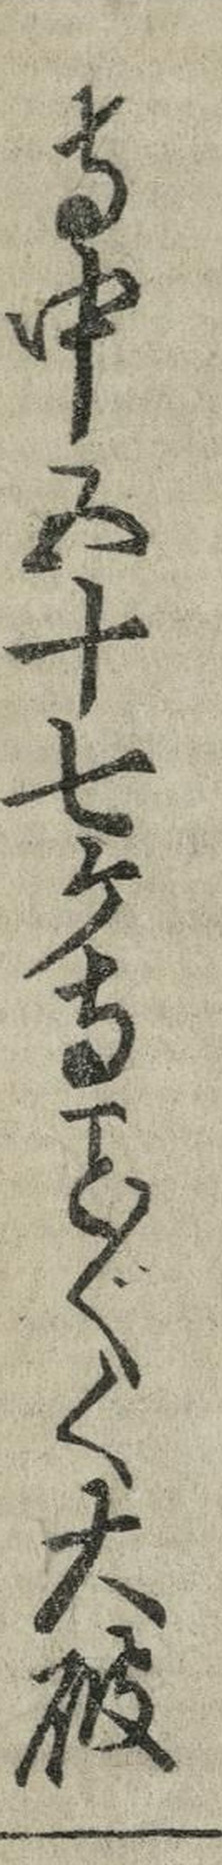寺中五十七ヶ寺こと〴〵く大破
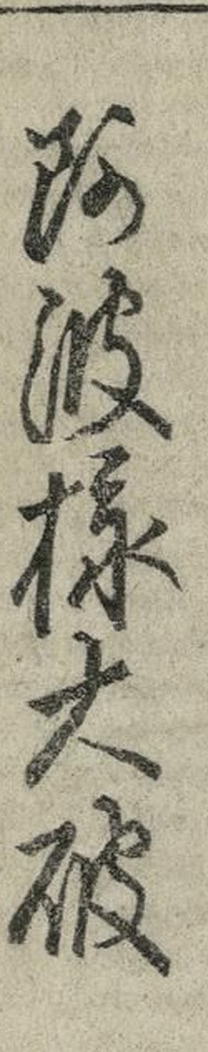阿波様大破
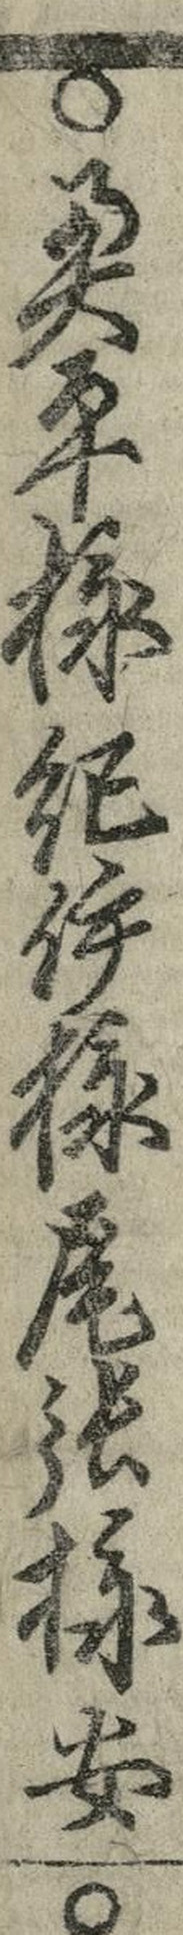○奥平様紀伊様尾張様安
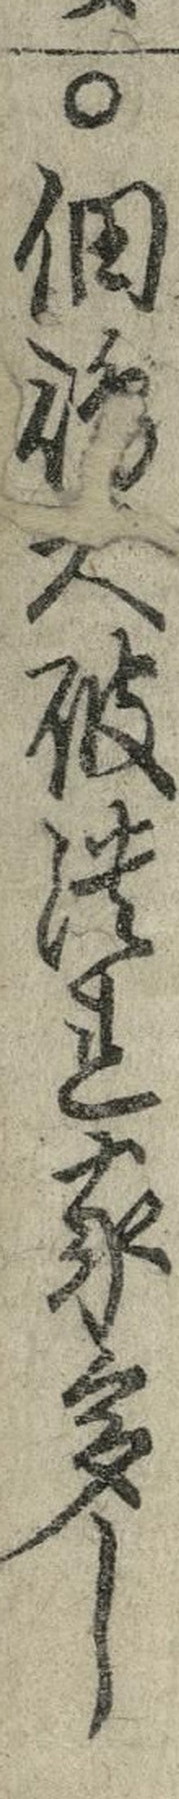○佃嶋大破潰れ家多し
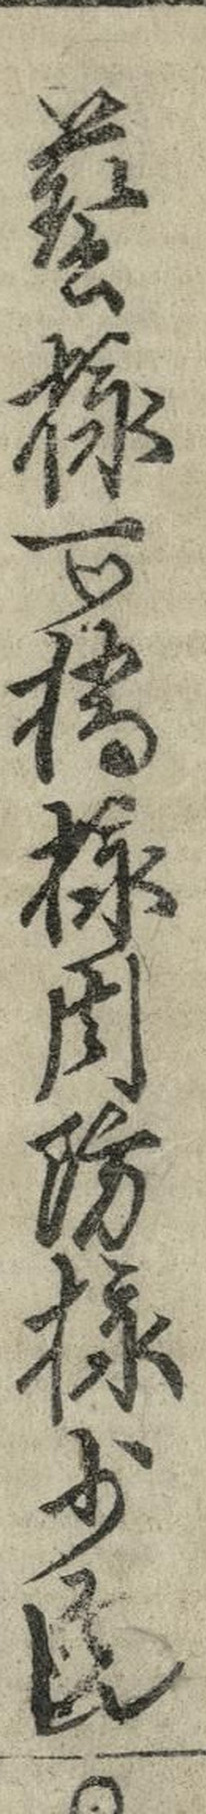芸様一ツ橋様周防様少そんし
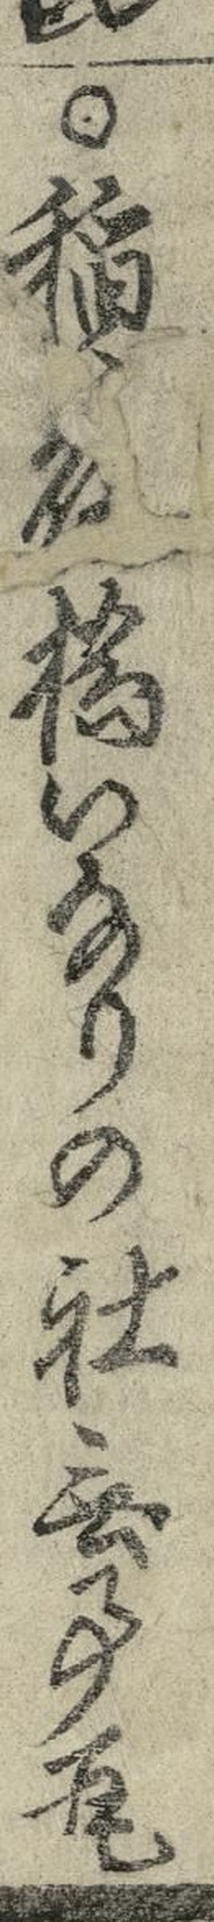○稲荷橋いなりの社無事瓦
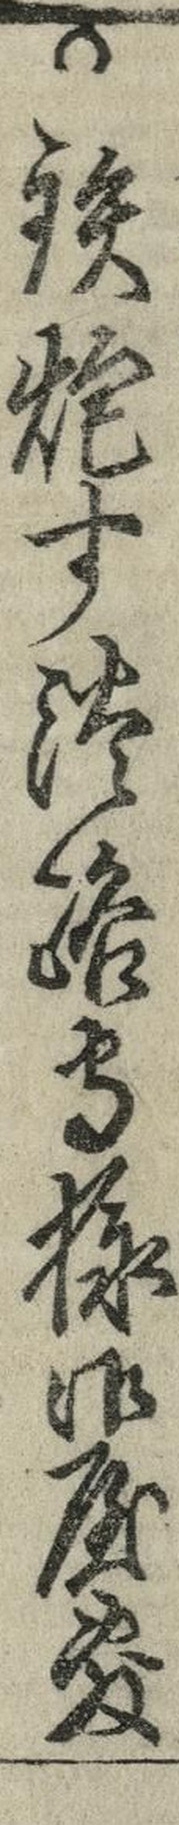○鉄炮す淡路守様御屋敷
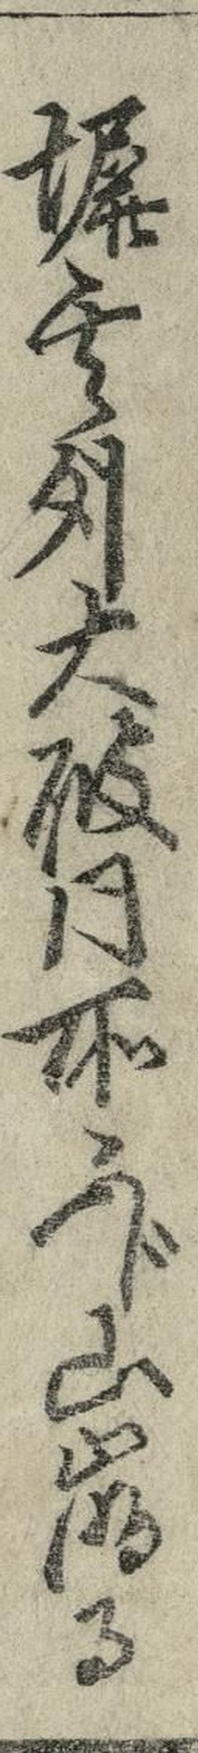塀其外大破同所ふじ山崩る
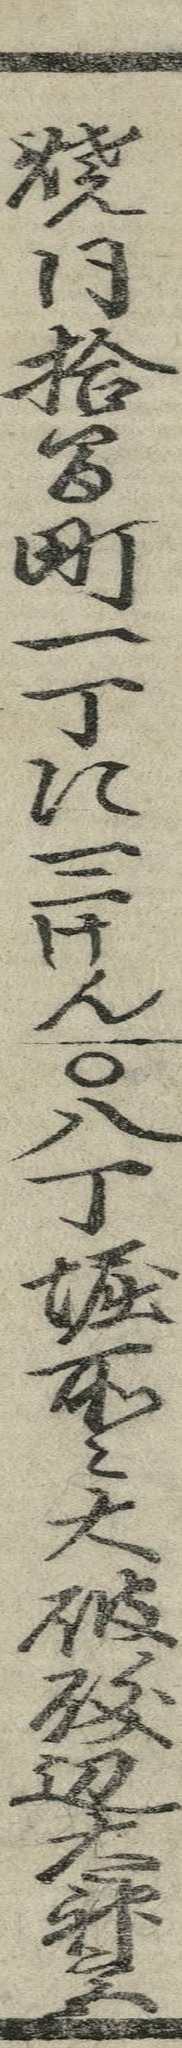焼同拾間町一丁に三けん
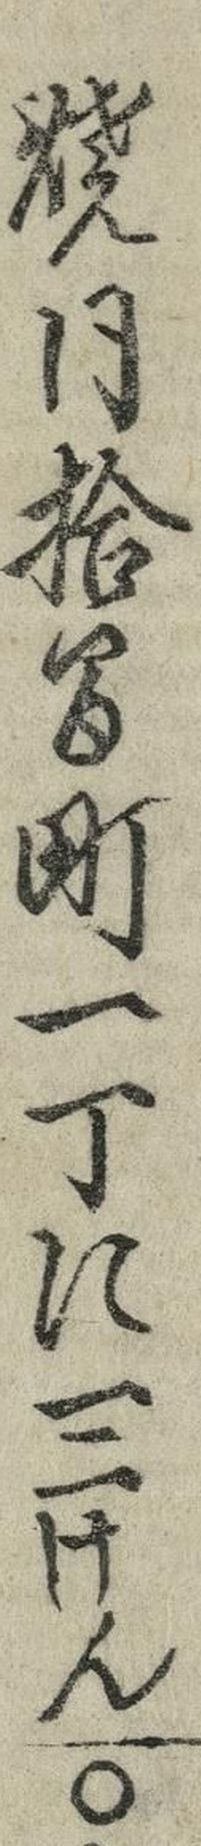焼同拾間町一丁に三けん
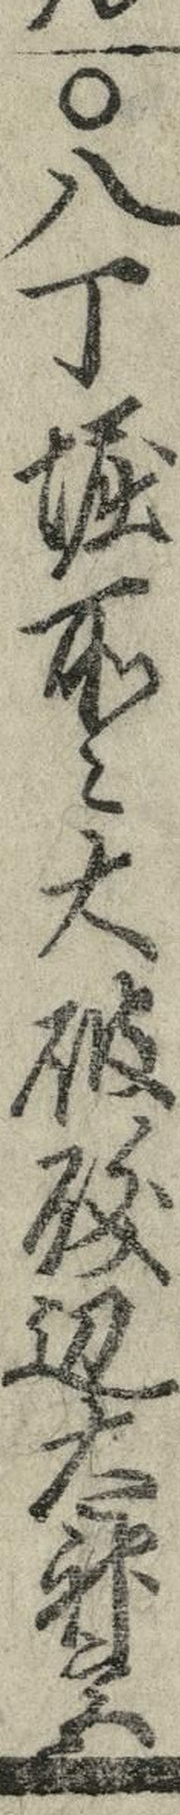○八丁堀所々大破磯辺大神宮
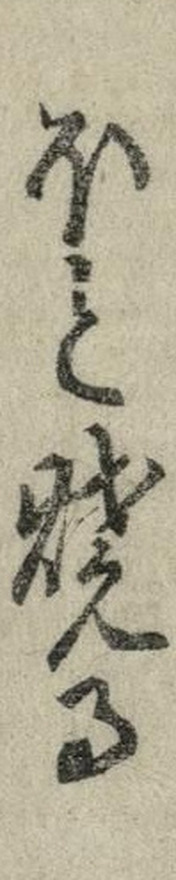ほと焼る
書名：江戸　大地震末代噺の種　全
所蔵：東京大学地震研究所図書室 Earthquake Research Institute Library, The University of Tokyo, JAPAN
